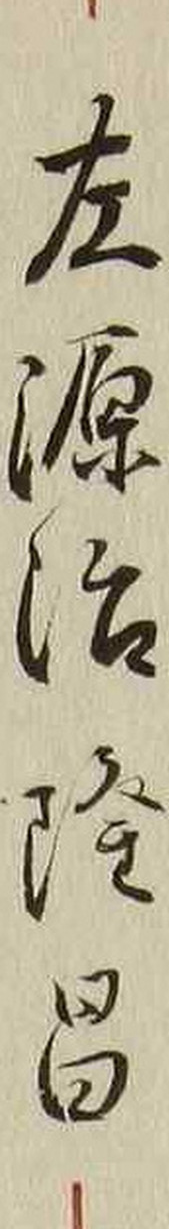左源治隆昌
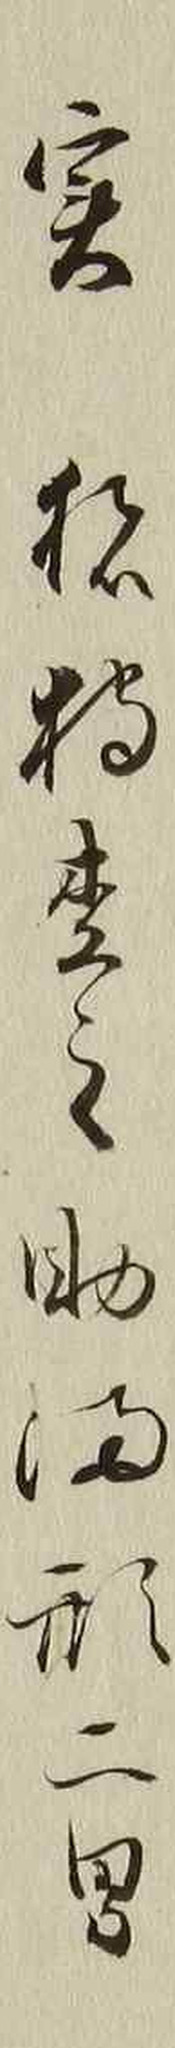実猪狩杢之助満形二男
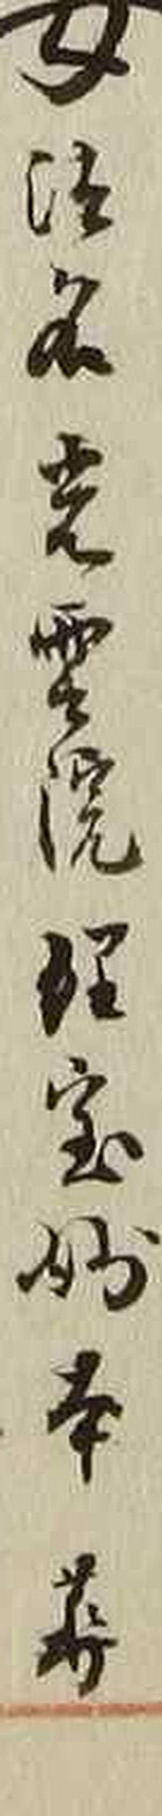法名光雲院理宝妙本葬
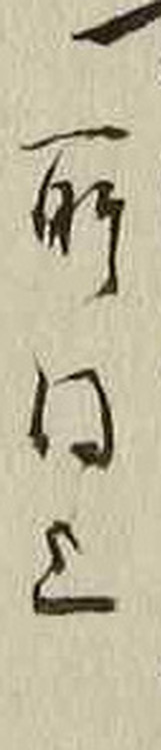所同上
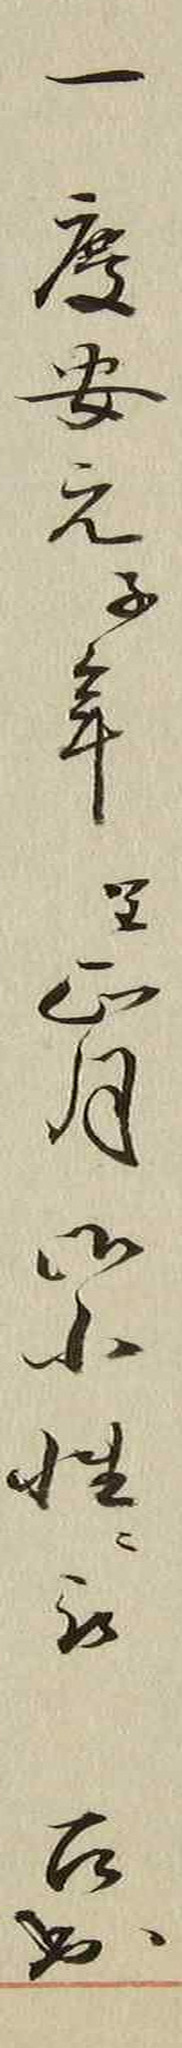一慶安元子年閏正月御小性ニ被召出
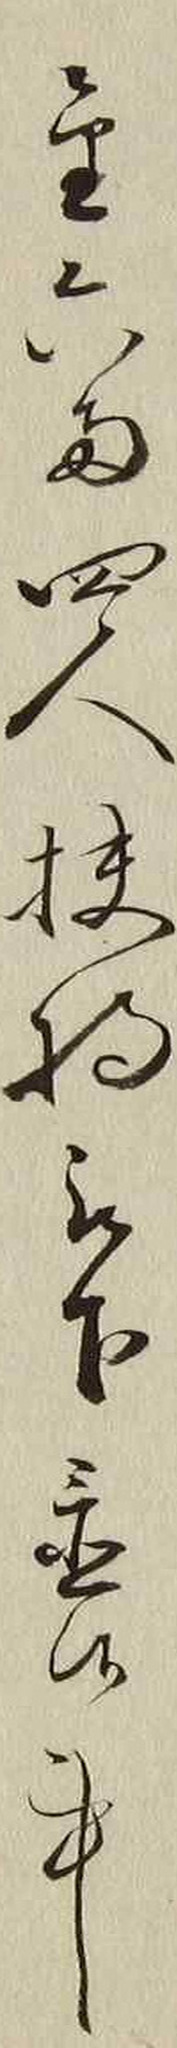金六両四人扶持被下置候事
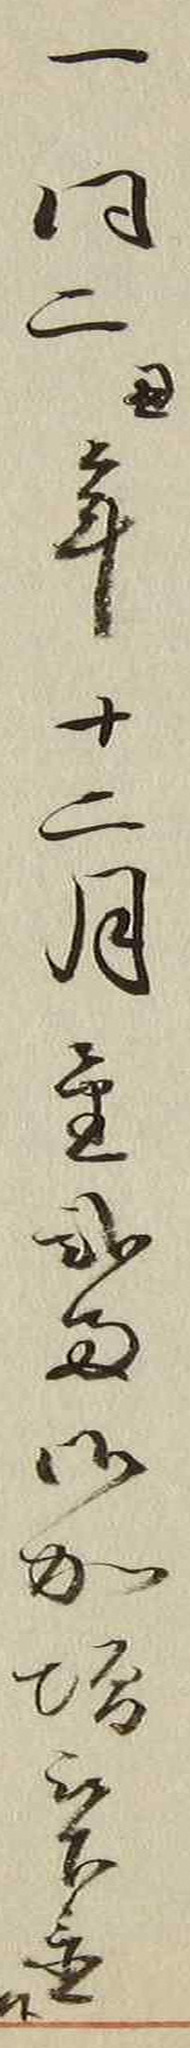一同二丑年十二月金弐両御加増被下置候
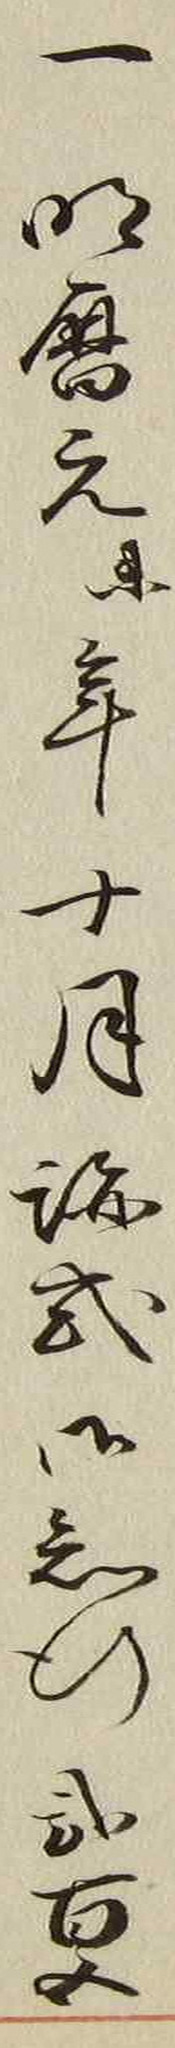一明暦元未年十月跡式御知行弐百五
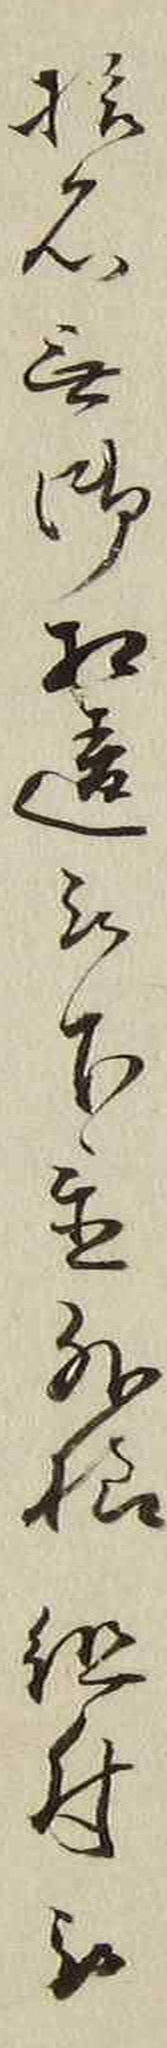拾石無御相違被下置外様組付被
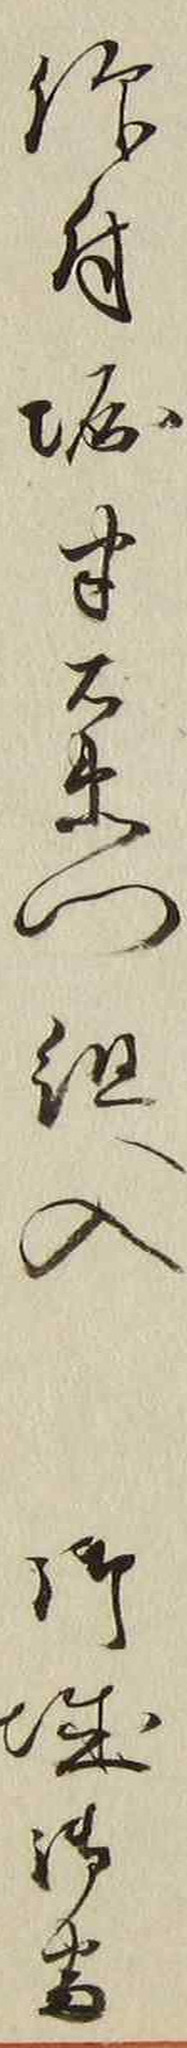仰付堀半右衛門組へ入御城御番
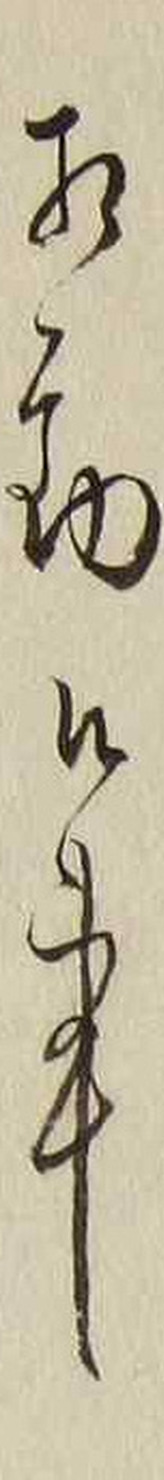相勤候事

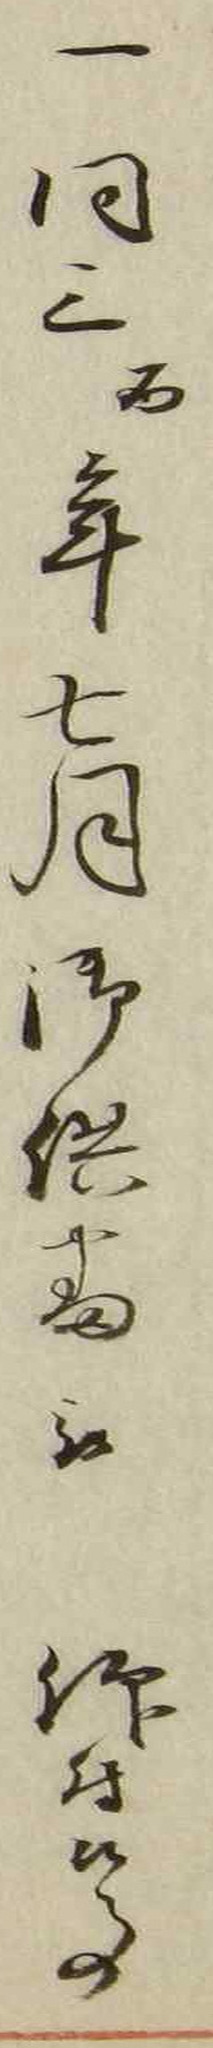一同三酉年七月御供番被仰付候事
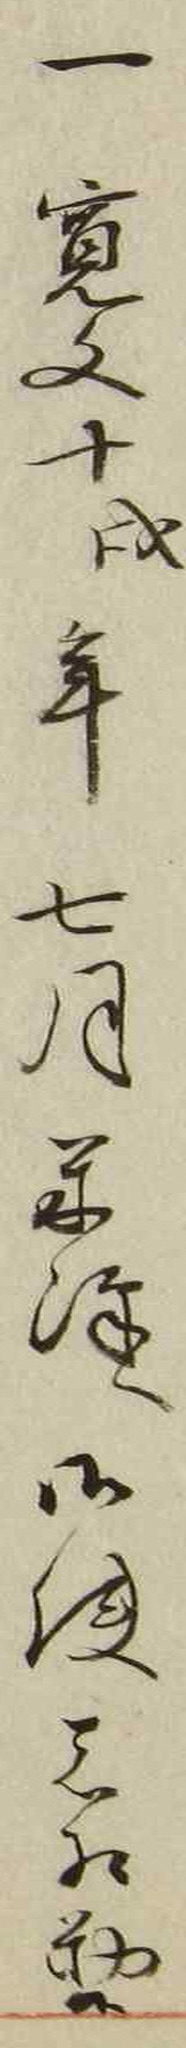一寛文十戌年七月米沢へ御使者相勤候
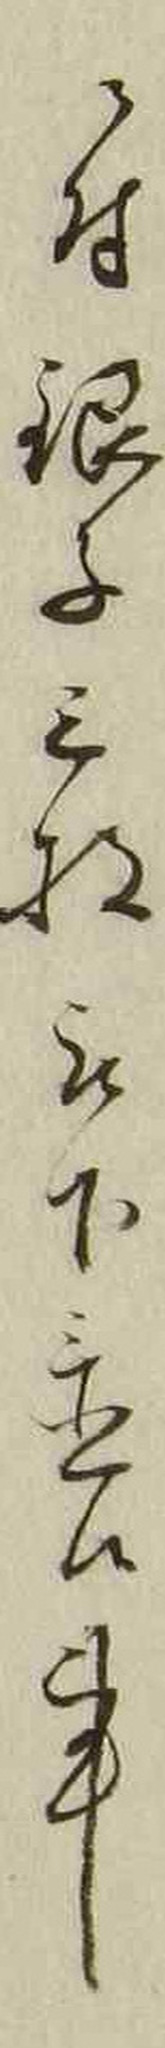ニ付銀子三枚被下置候事
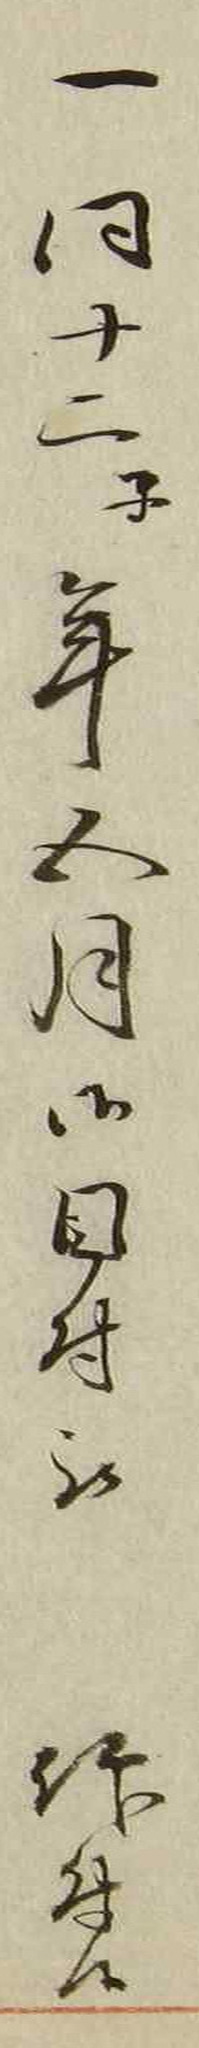一同十二子年五月御目付被仰付候
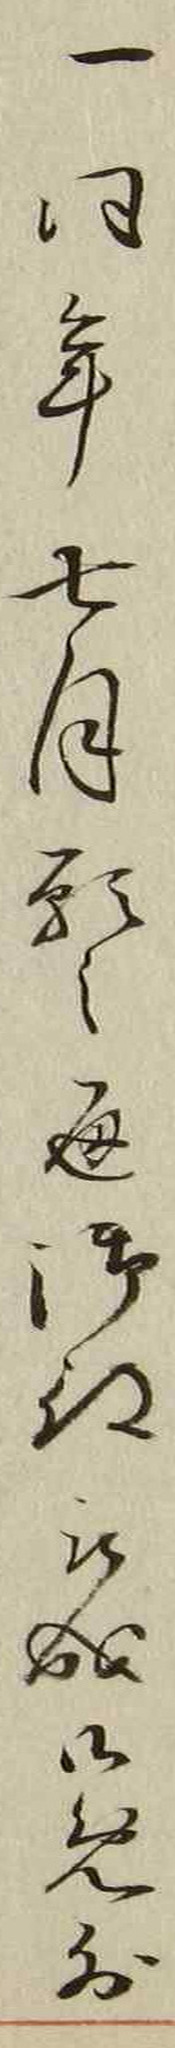一同年七月願之通御役被成御免外
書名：諸士系譜　巻之28　い之部28
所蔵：会津若松市立会津図書館
